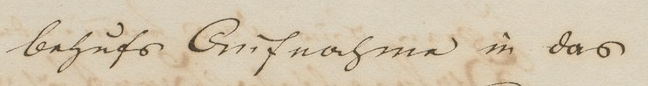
behufs Aufnahme in das
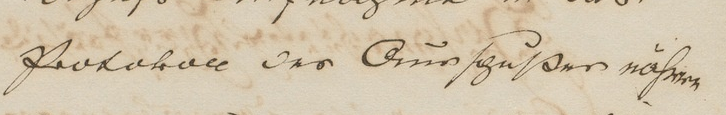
Protokoll des Ausschußes nähere
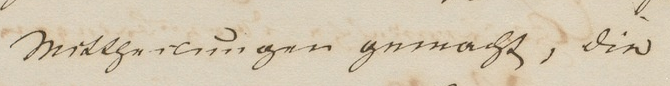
Mittheilungen gemacht, die
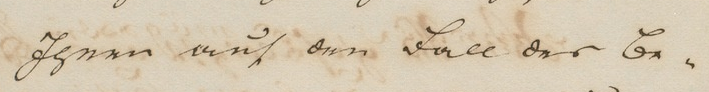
Ihnen auf den Fall des Be-
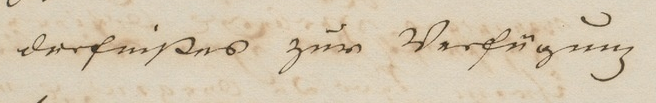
dürfnißes zur Verfügung
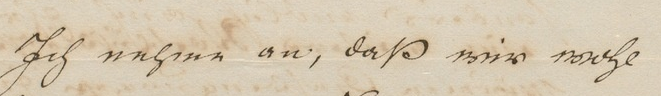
Ich nehme an, daß wir wohl
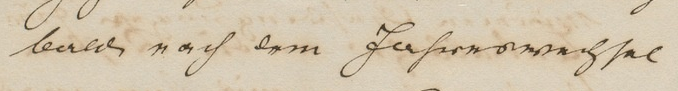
bald nach dem Jahreswechsel
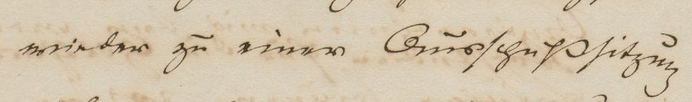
wieder zu einer Ausschußsitzung
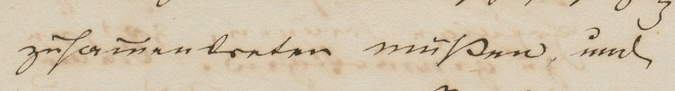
zusammentreten müßen und
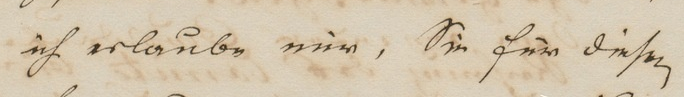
ich erlaube mir, Sie für diesen
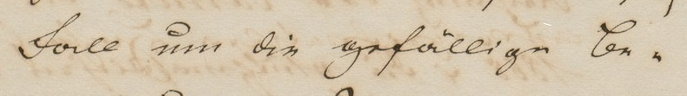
Fall um die gefällige Be-
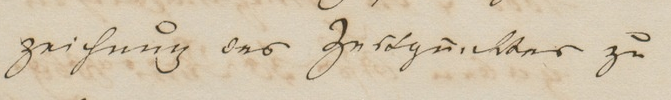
zeichnung des Zeitpunktes zu
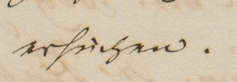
ersuchen.
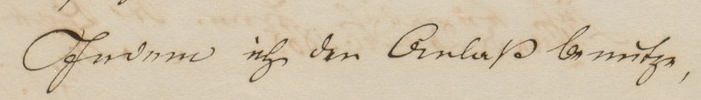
Indem ich den Anlaß benutze,
